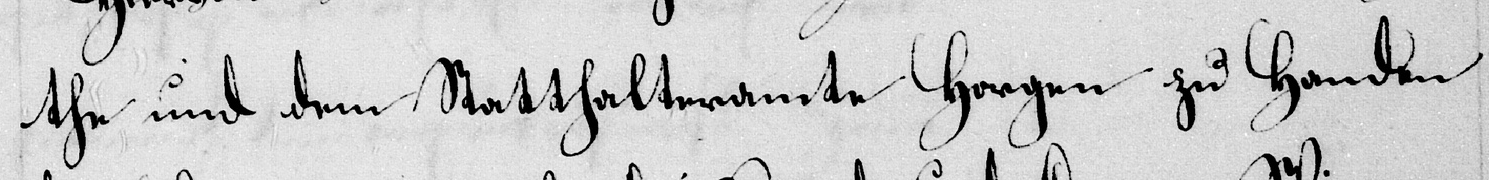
the und dem Statthalteramte Horgen zu Handen
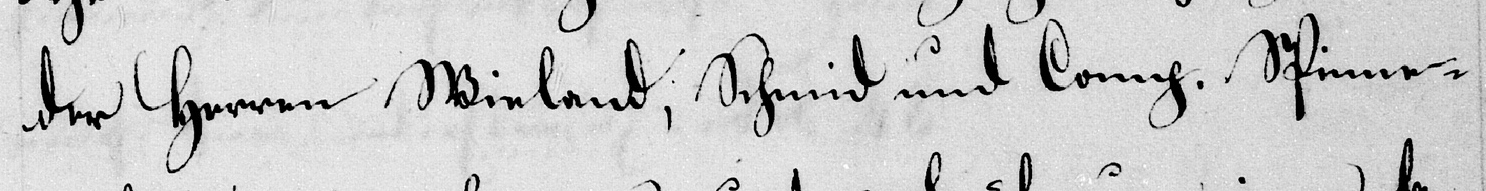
der Herren Wieland, Schmid und Comp. Spinne¬
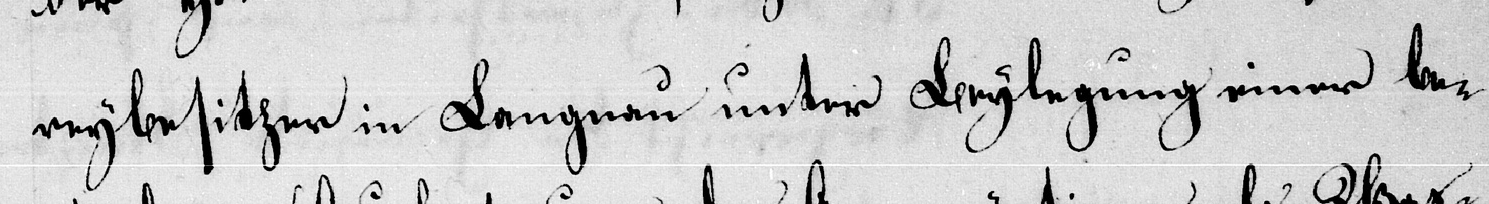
reybesitzer in Langnau unter Beylegung einer be¬
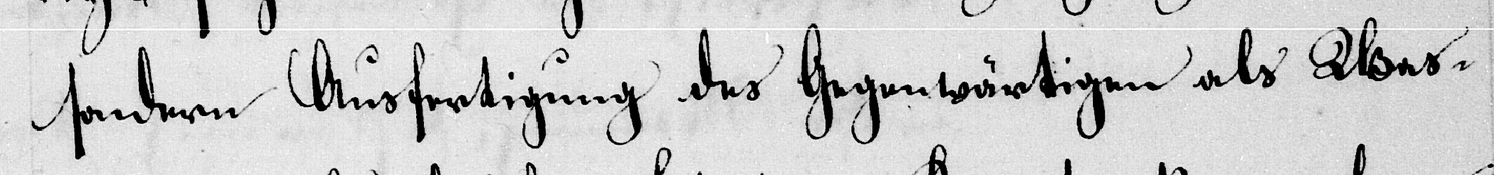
sondern Ausfertigung des Gegenwärtigen als Waß¬
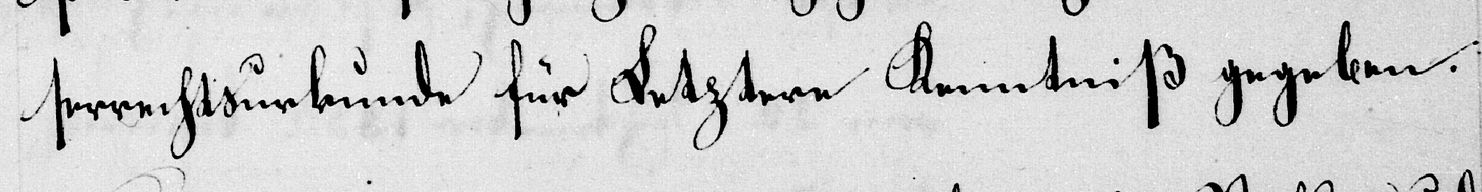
errechtsurkunde für Letztere Kenntniß gegeben.
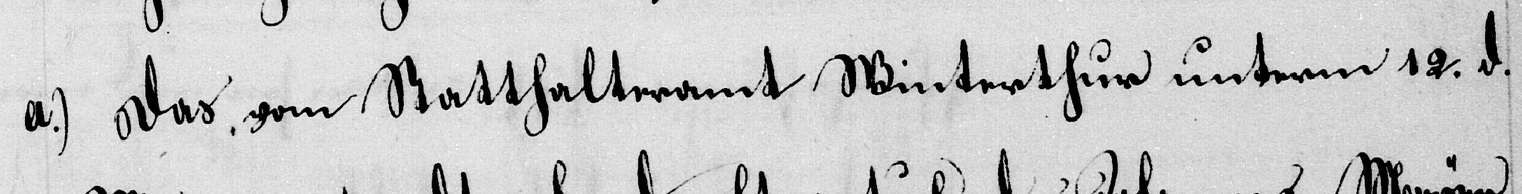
a.) Das vom Statthalteramt Winterthur unterm 12. d.
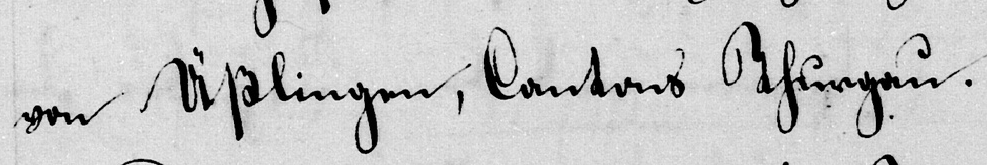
von Üßlingen, Cantons Thurgau.
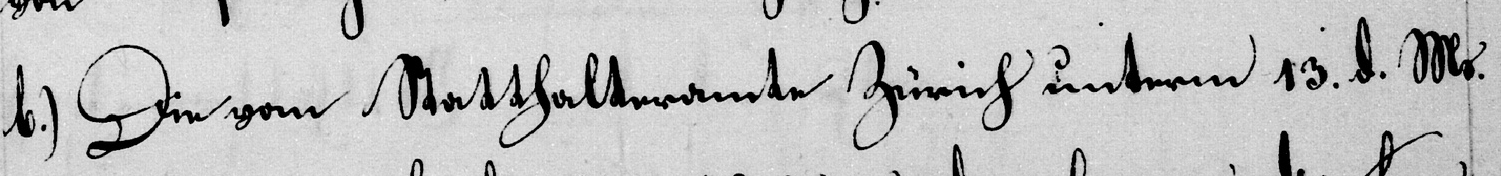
b.) Die vom Statthalteramte Zürich unterm 13. d. Ms.
